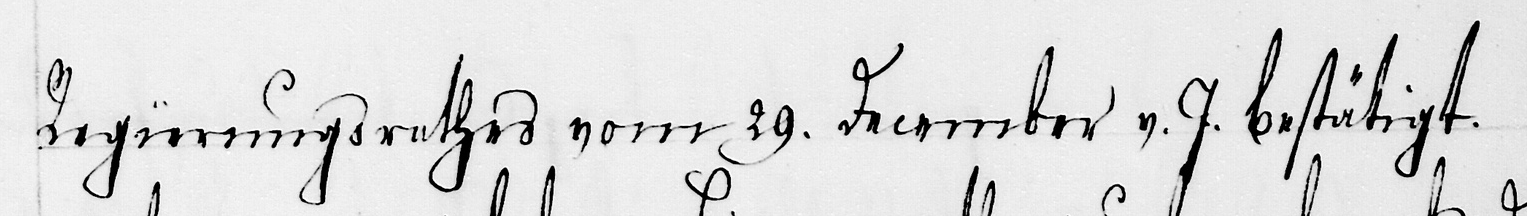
Regierungsrathes vom 29. December v. J. bestätigt.
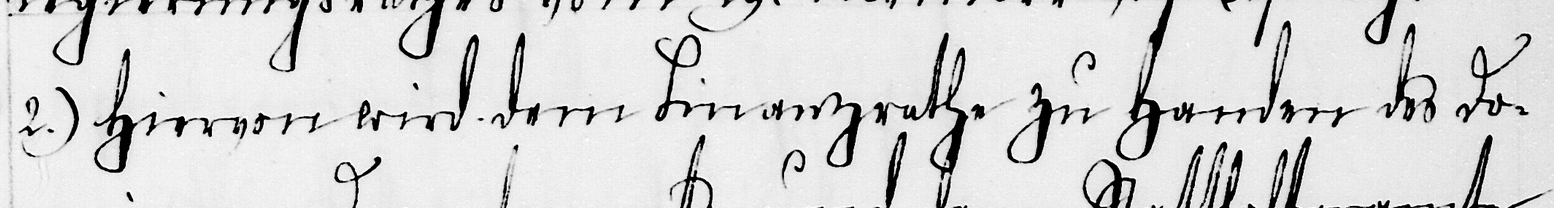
2.) Hiervon wird dem Finanzrathe zu Handen des Do¬
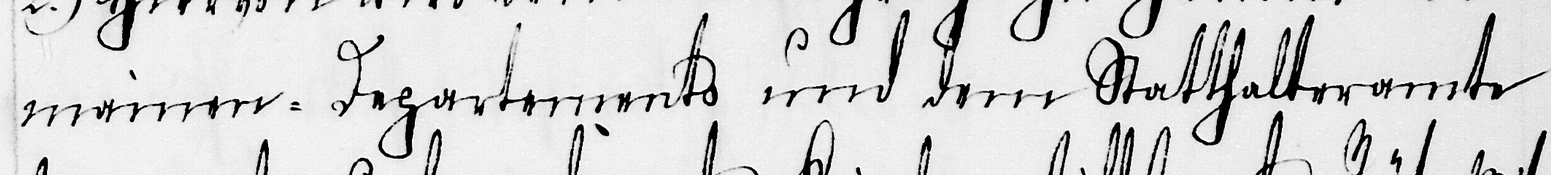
mainen-Departements und dem Statthalteramte
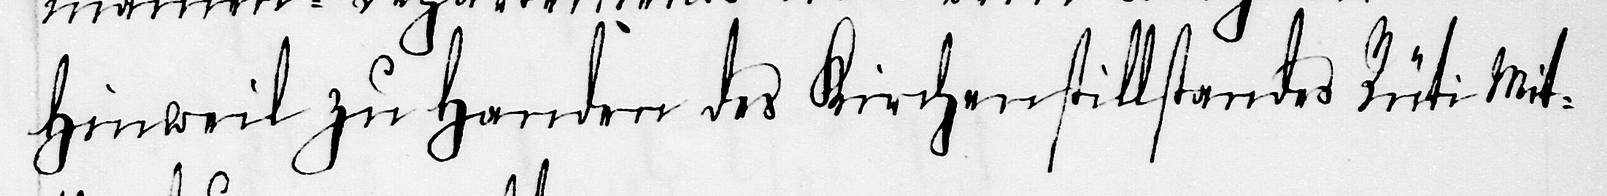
Hinweil zu Handen des Kirchenstillstandes Rüti Mit¬
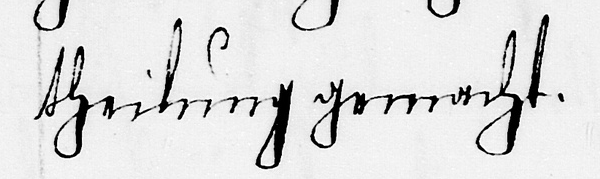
theilung gemacht.
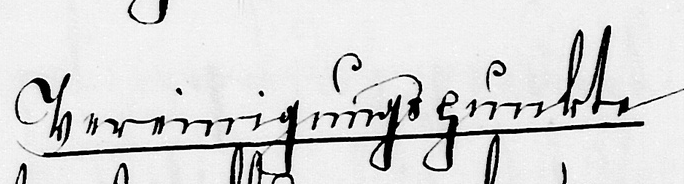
Vereinigungspunkte
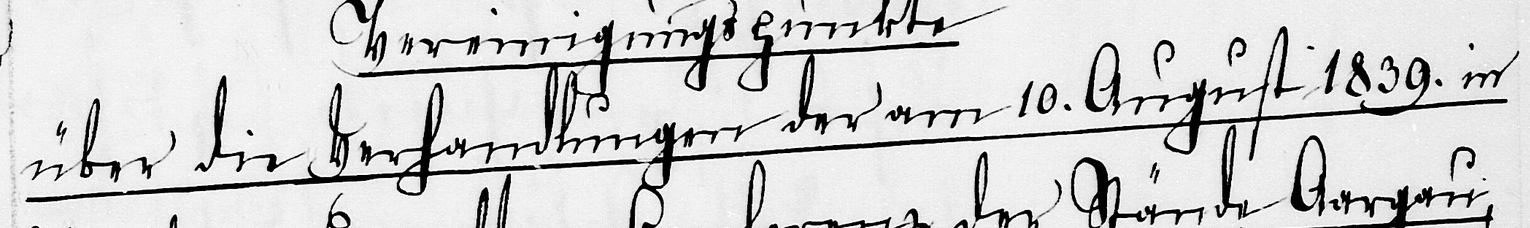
über die Verhandlungen der am 10. August 1839. in
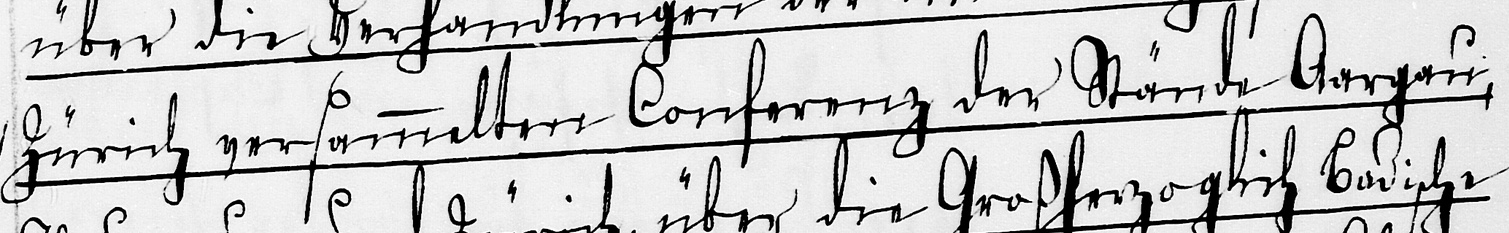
Zürich versammelten Conferenz der Stände Aargau,
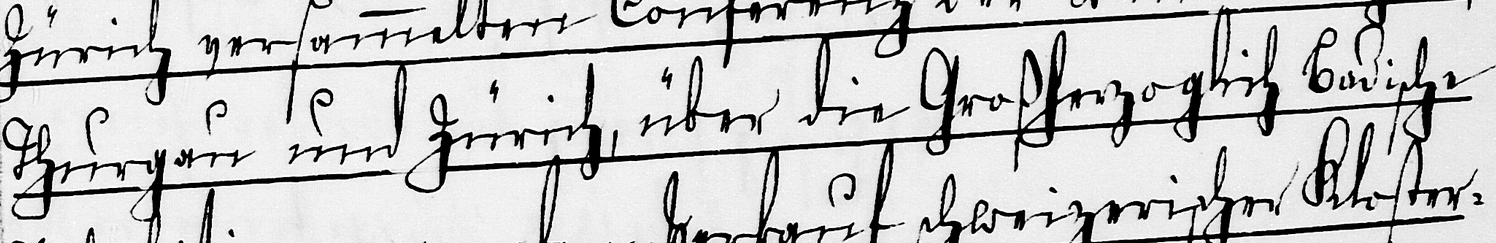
Thurgau und Zürich, über die Großherzoglich Badische
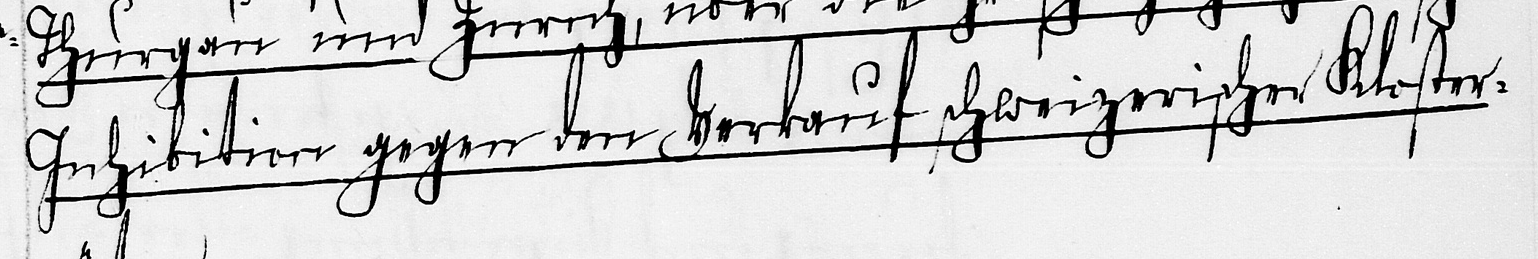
Inhibition gegen den Verkauf schweizerischer Kloster¬
